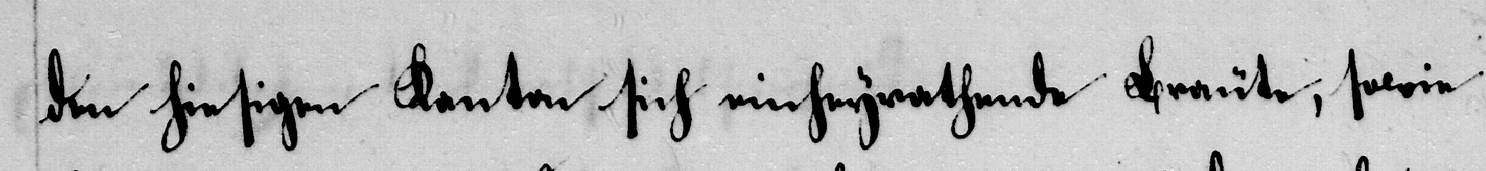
den hiesigen Kanton sich einheyrathende Bräute, sowie
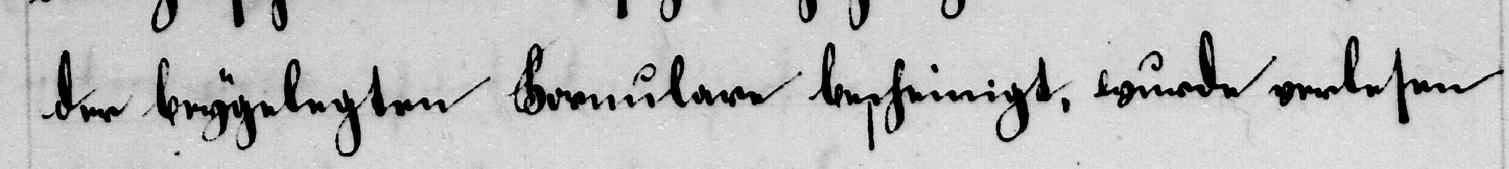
der beygelegten Formulare bescheinigt, wurde verlesen
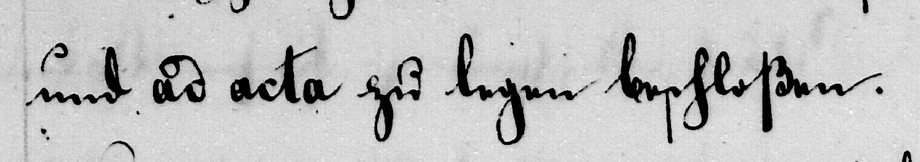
und ad acta zu legen beschloßen.
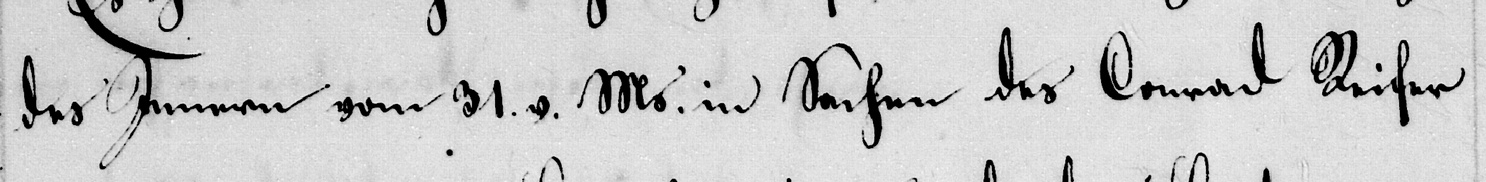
des Innern vom 31. v. Ms. in Sachen des Conrad Reifer
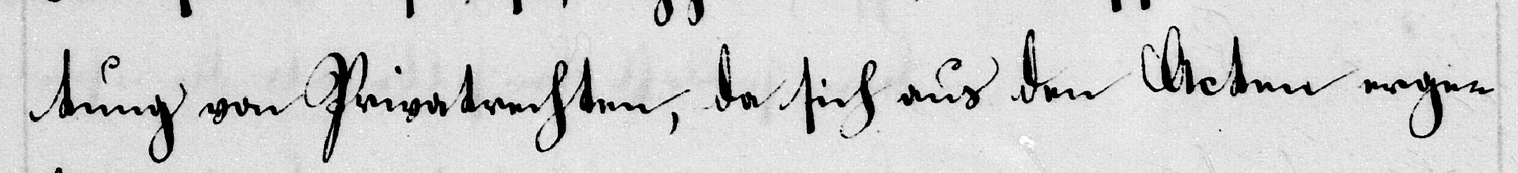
tung von Privatrechten, da sich aus den Acten erge¬
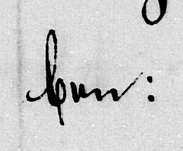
ben:
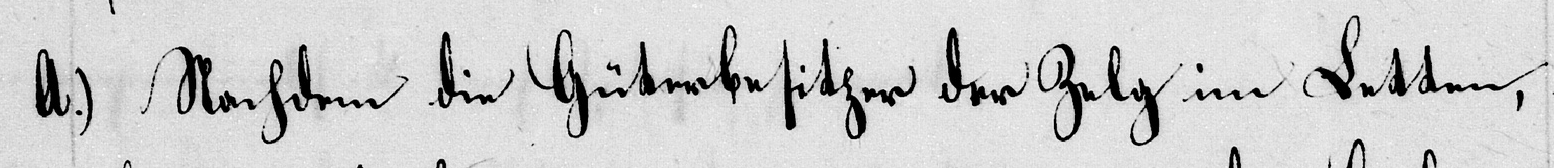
A.) Nachdem die Güterbesitzer der Zelg im Letten,
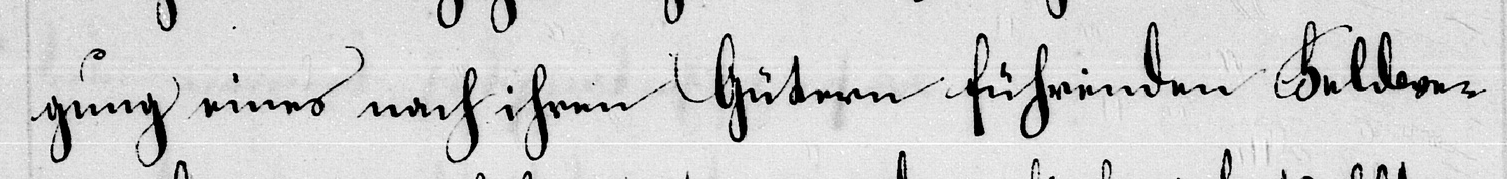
gung eines nach ihren Gütern führenden Feldwe¬
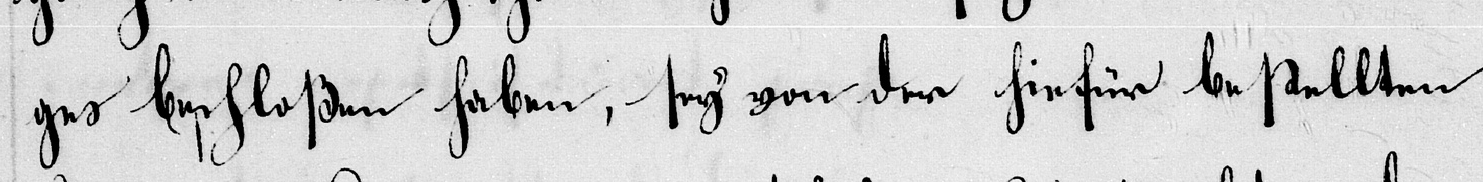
ges beschloßen haben, sey von der hiefür bestellten
